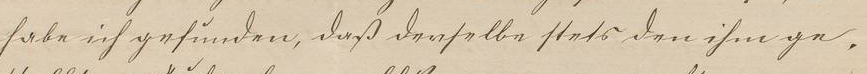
habe ich gefunden, daß derselbe stets den ihm ge-
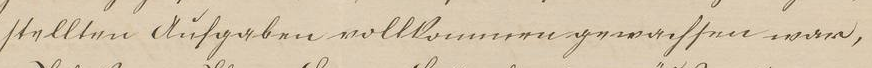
stellten Aufgaben vollkommen gewachsen war.
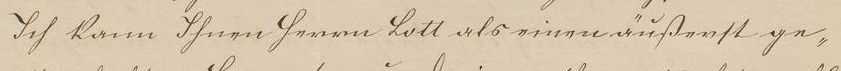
Ich kann Ihnen Herrn Lott als einen äußerst ge-
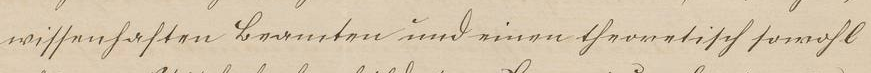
wissenhaften Beamten und einen theoretisch sowohl
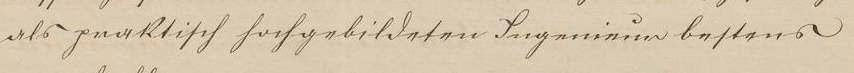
als praktisch hochgebildeten Ingenieur bestens
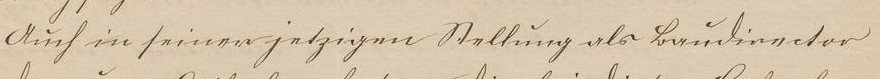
Auch in seiner jetzigen Stellung als Baudirector
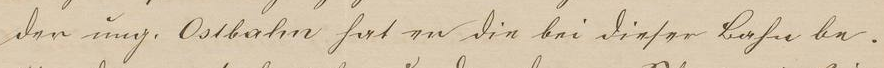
der ung. Ostbahn hat er die bei dieser Bahn be
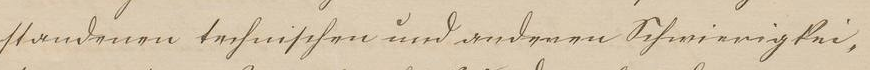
standenen technischen und anderen Schwierigkei-
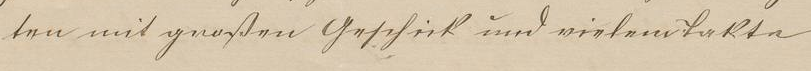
ten mit großem Geschick und vielem Takte
